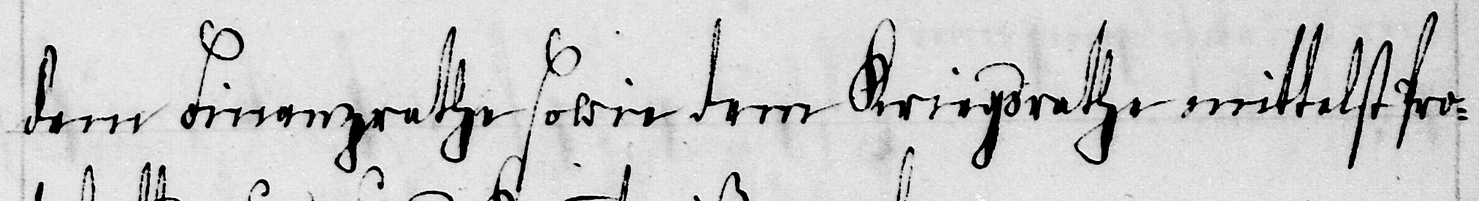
dem Finanzrathe sowie dem Kriegsrathe mittelst Pr¬
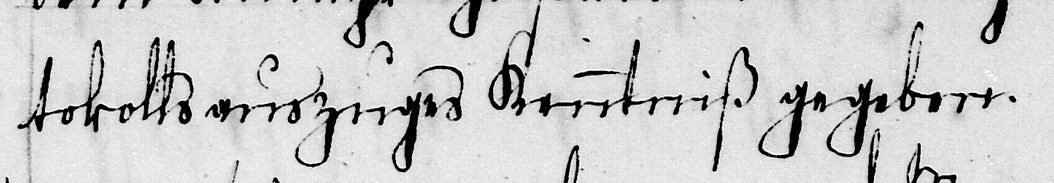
otokollsauszuges Kenntniß gegeben.
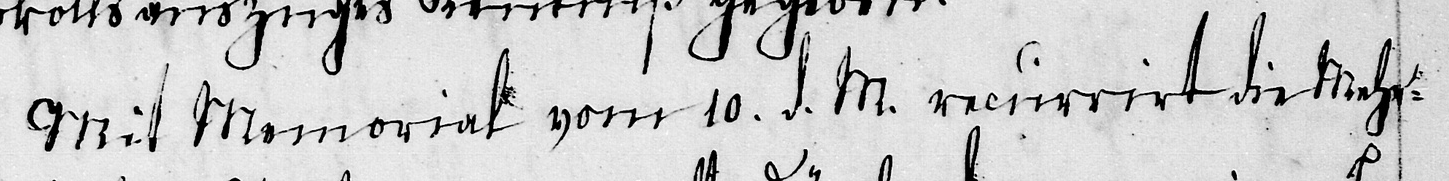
Mit Memorial vom 10. d. M. recurrirt die Mehr¬
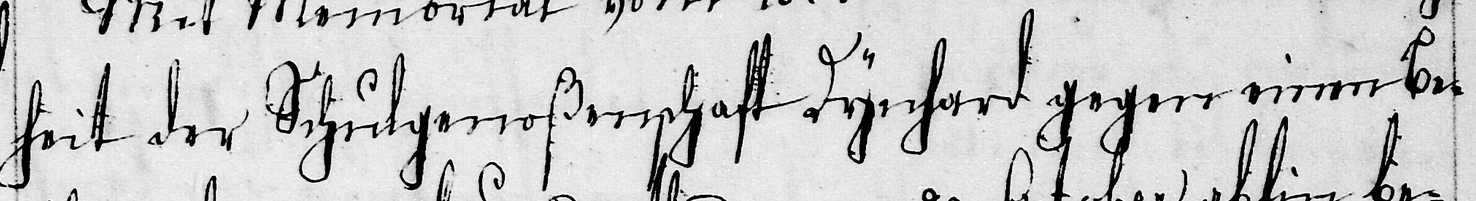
heit der Schulgenoßenschaft Dynhard gegen einen Be¬
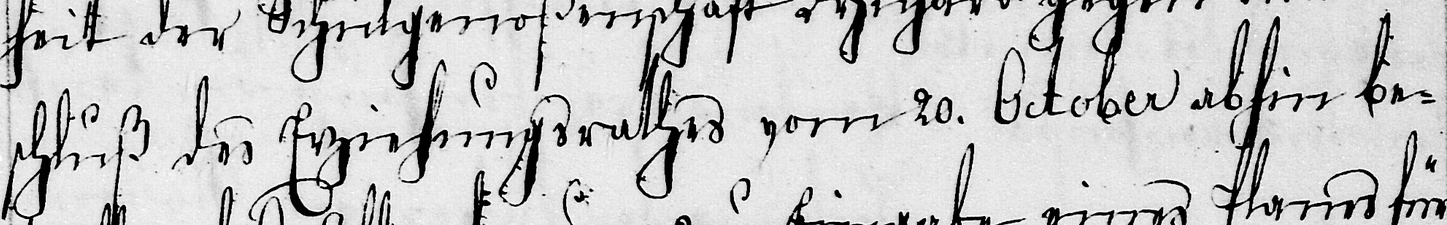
chluß des Erziehungsrathes vom 20. October abhin be¬
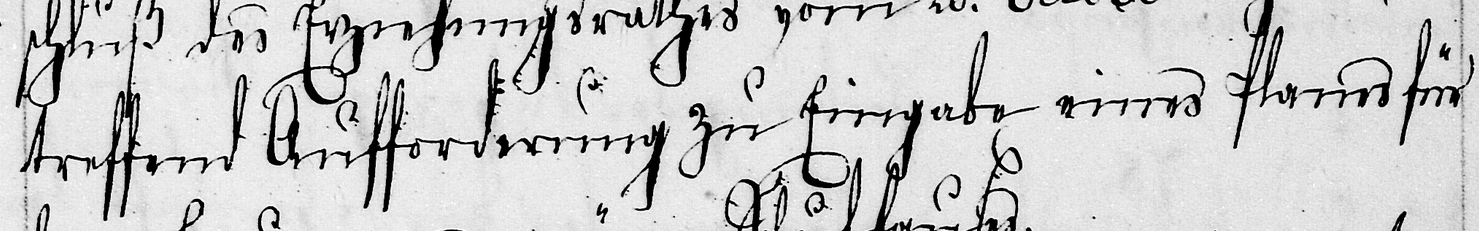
treffend Aufforderung zu Eingabe eines Planes für
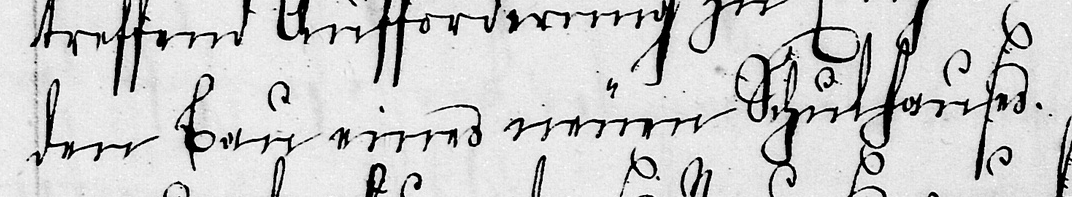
den Bau eines neuen Schulhauses.
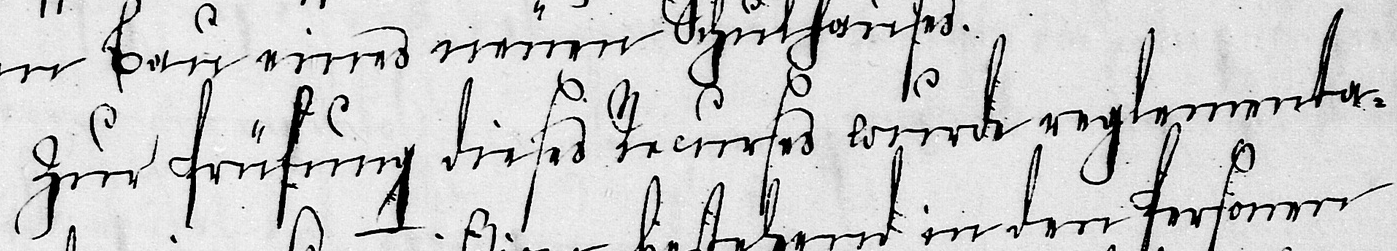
Zur Prüfung dieses Recurses wurde reglementa¬
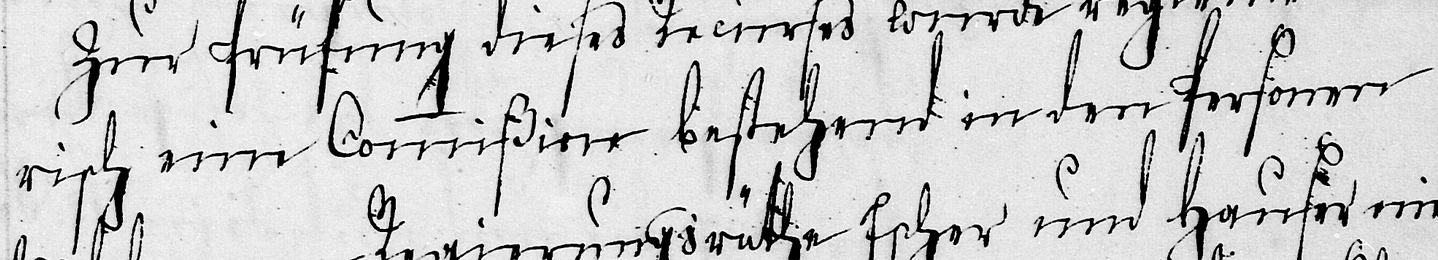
risch eine Commißion bestehend in den Personen
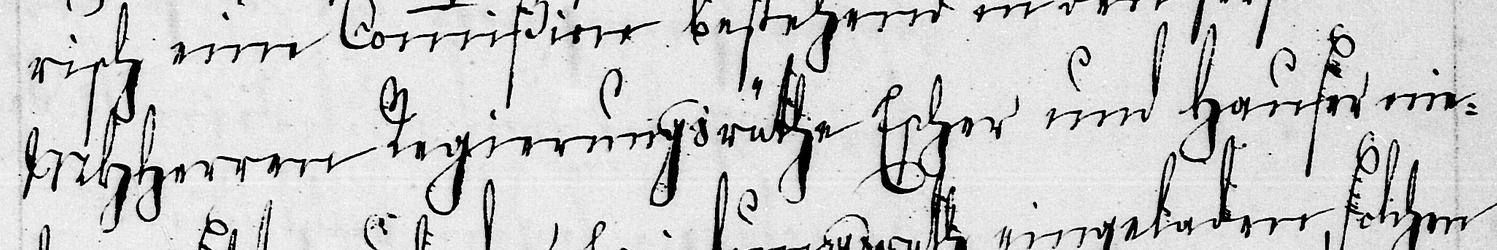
MHHerren Regierungsräthe Escher und Hauser nie¬
